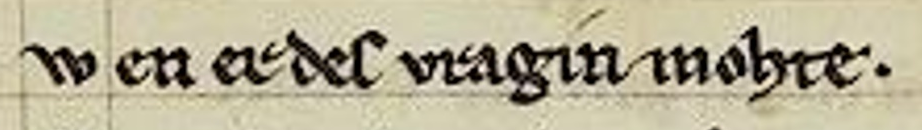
Wen er deſ vragin mohte.
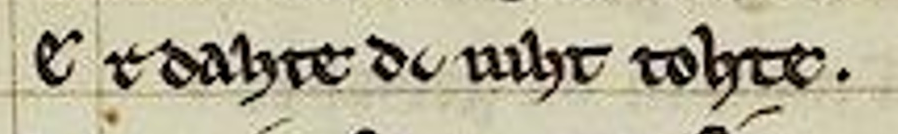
Er dahte d(az) niht tohte.
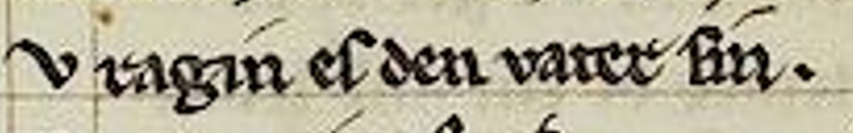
Vragin eſ den vater ſin.
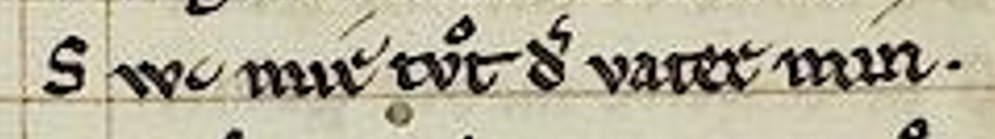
Sw(az) mir tv°ot d(er) vater min.
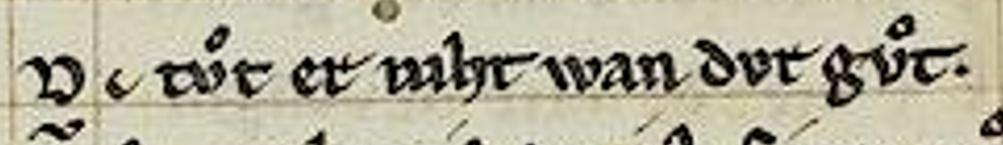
D(az) tv°ot er niht wan dvr gv°ot.
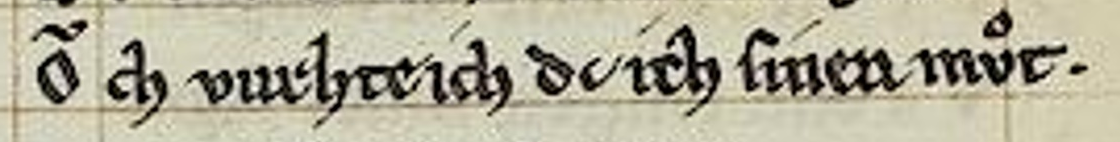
O°vch vurhte ich d(az) ich ſinen mv°ot.
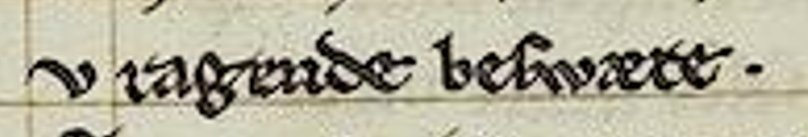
Vragende beſw[ae]re.
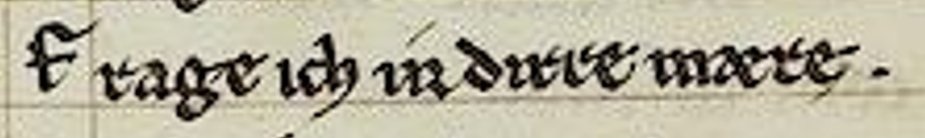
Frage ich in dirre m[ae]re.
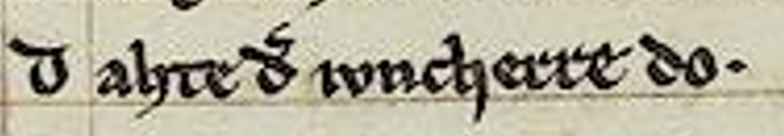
Dahte d(er) iuncherre do.
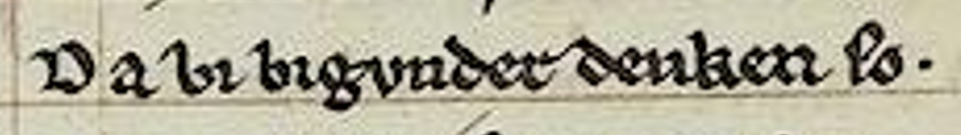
Da bi bigvnder denken ſo.
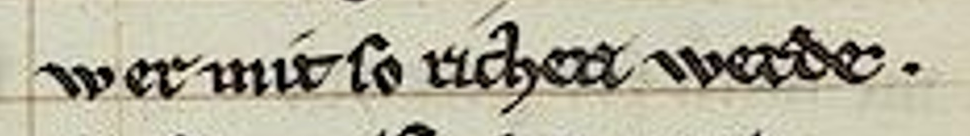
Wer mit ſo richen werde.
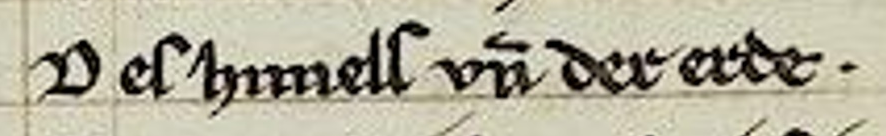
Deſ himelſ vn(d) der erde.
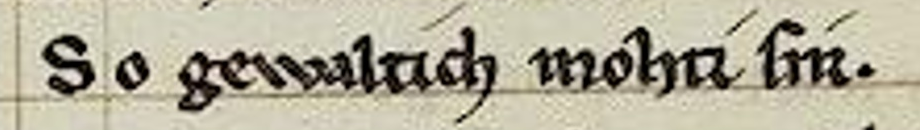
So gewaltich mohti ſin.
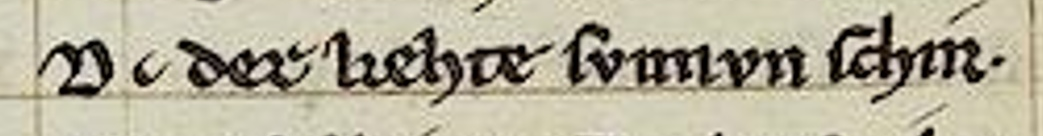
D(az) der liehte ſvnnvn ſchin.
